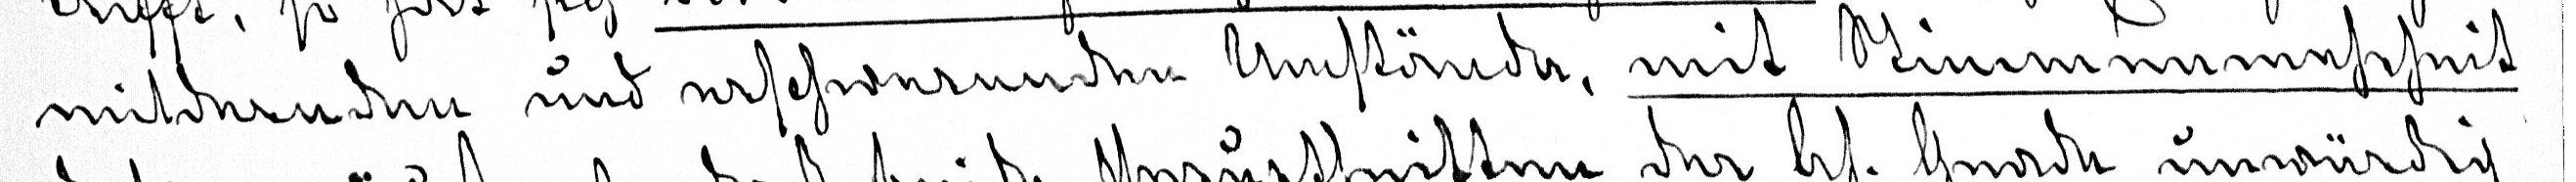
mildernden und erschwerenden Umstände, mit Stimmenmehrheit
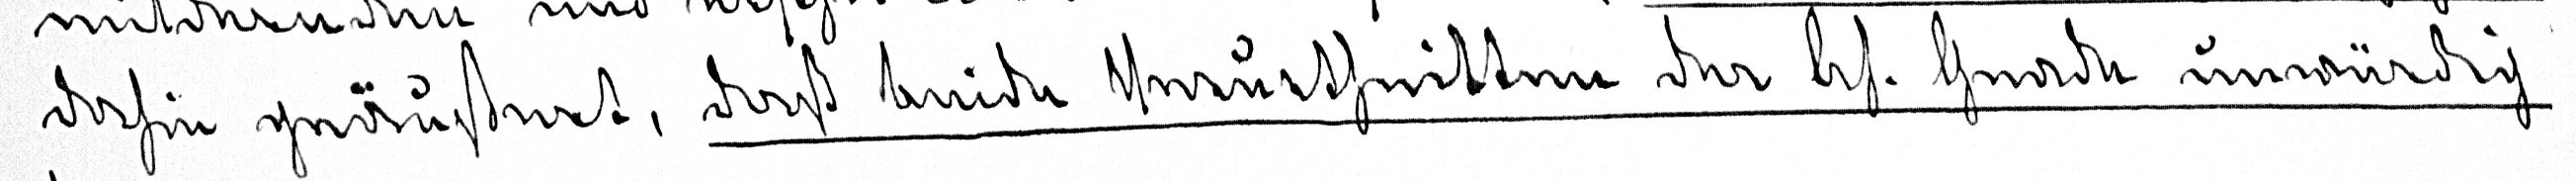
dahin geäußert, daß beide Verurtheilten der Ah. Gnade unwürdig
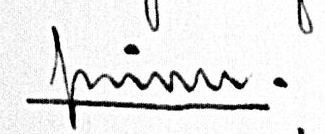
seine.
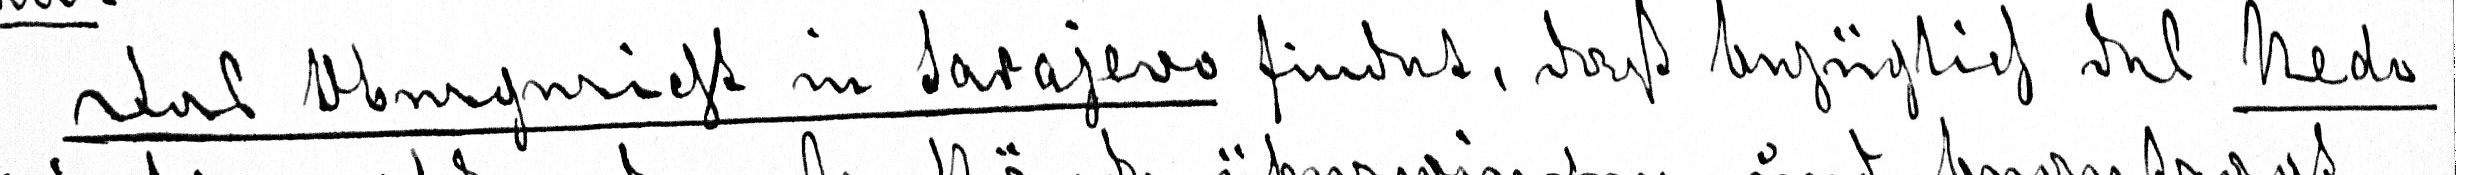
Das Obergericht in Sarajevo findet, daß bezüglich des Nedo
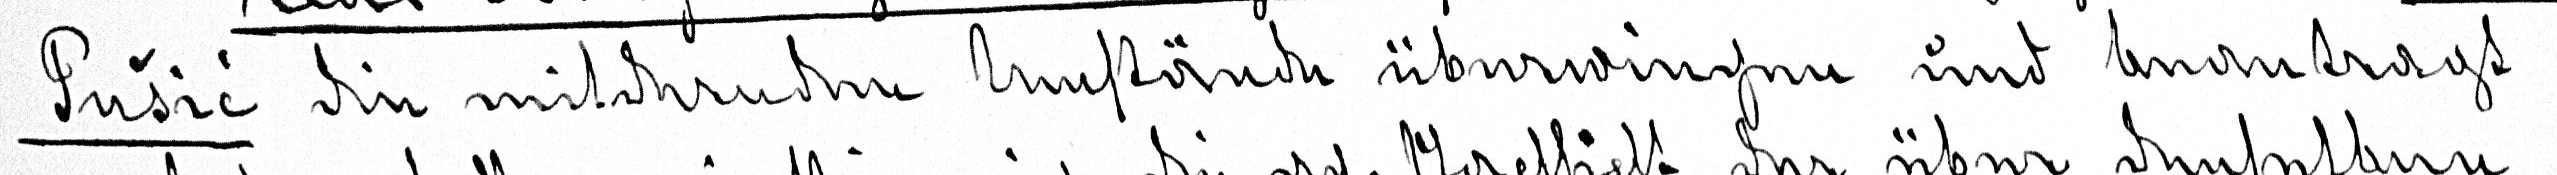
Pusić die mildernden Umstände überwiegen und beantragt
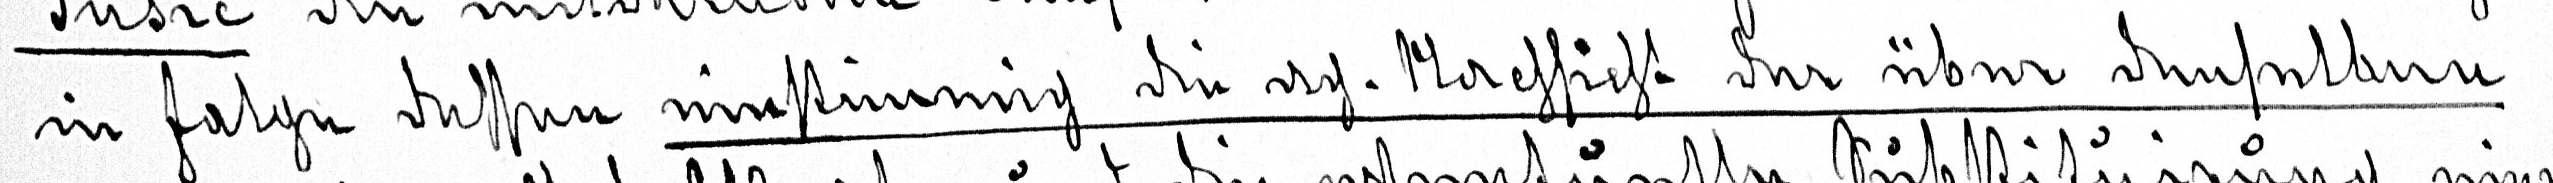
in folge dessen einstimmig die ag. Nachsicht der über denselben
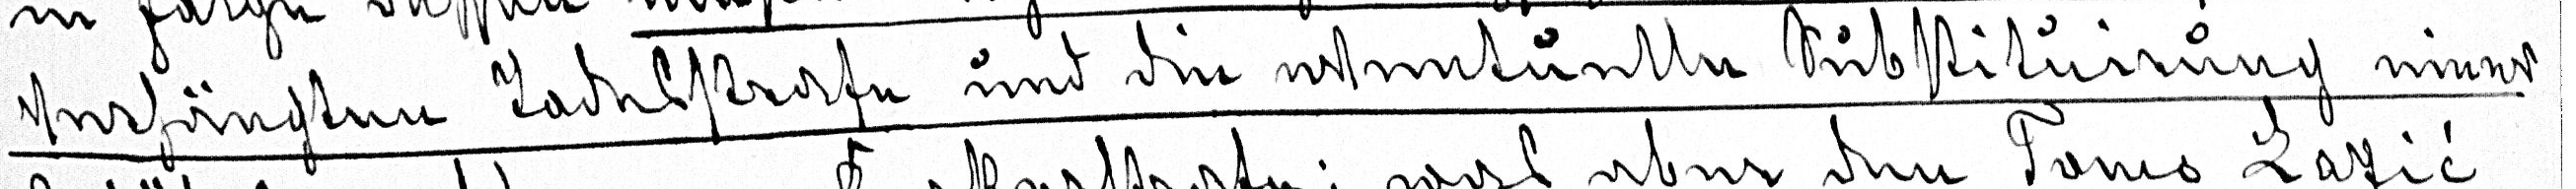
verhängten Todesstrafe und die eventuntte Substituirung einer
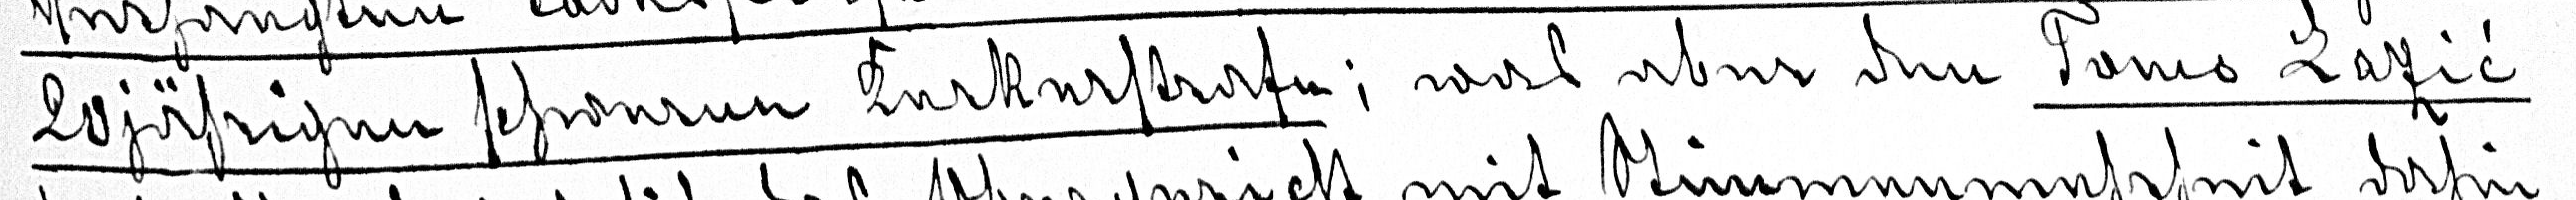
20 jährigen schweren Kerkerstrafe; was aber den Tomo Lazić
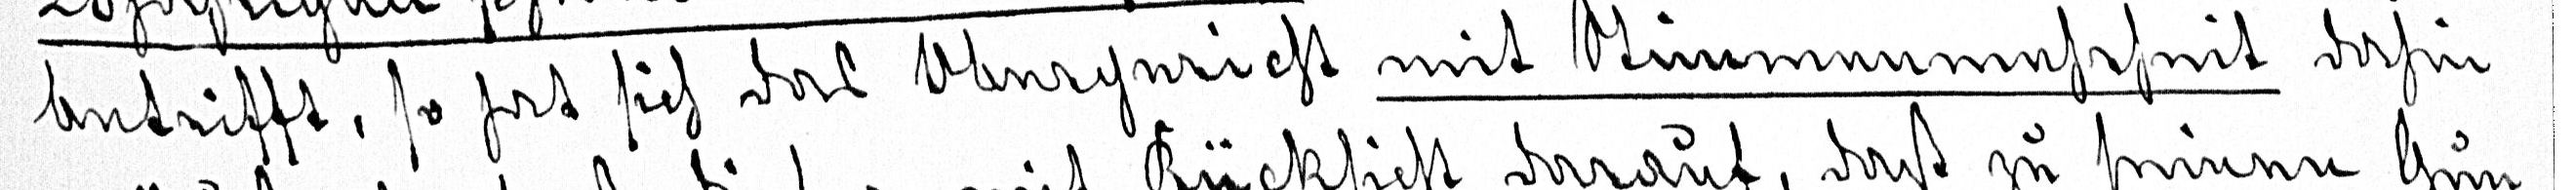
betrifft, so hat sich das Obergericht mit Stimmenmehrheit dahin
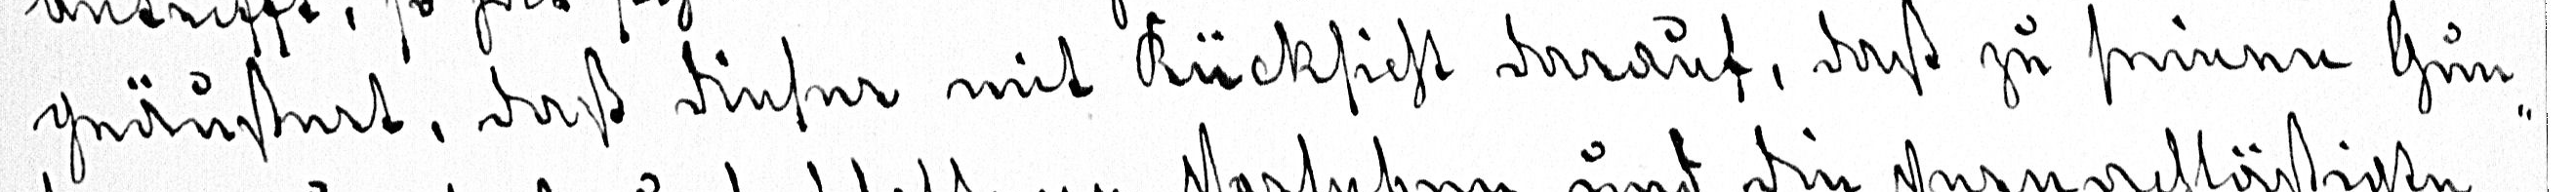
geäußert, daß dieser mit Rücksicht darauf, daß zu seinen Gun¬
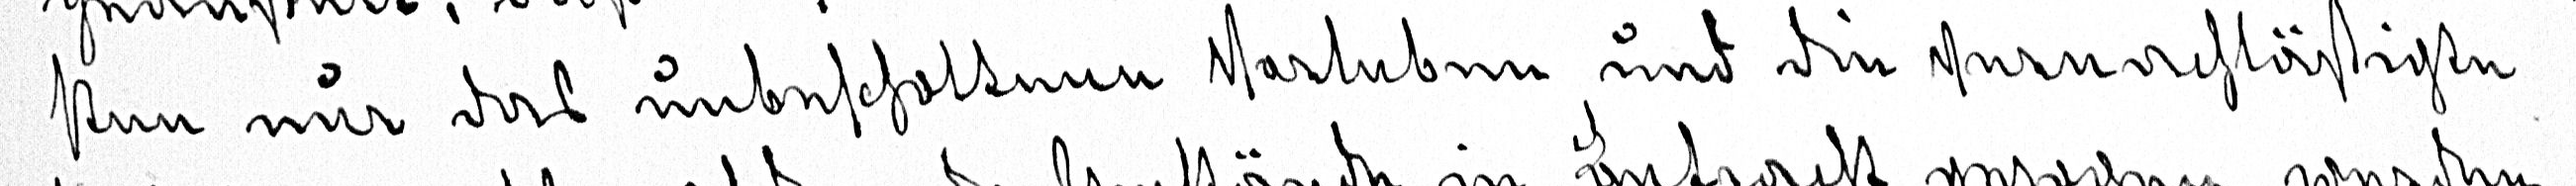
sten nur das unbescholtene Vorleben und die vernachläßigte
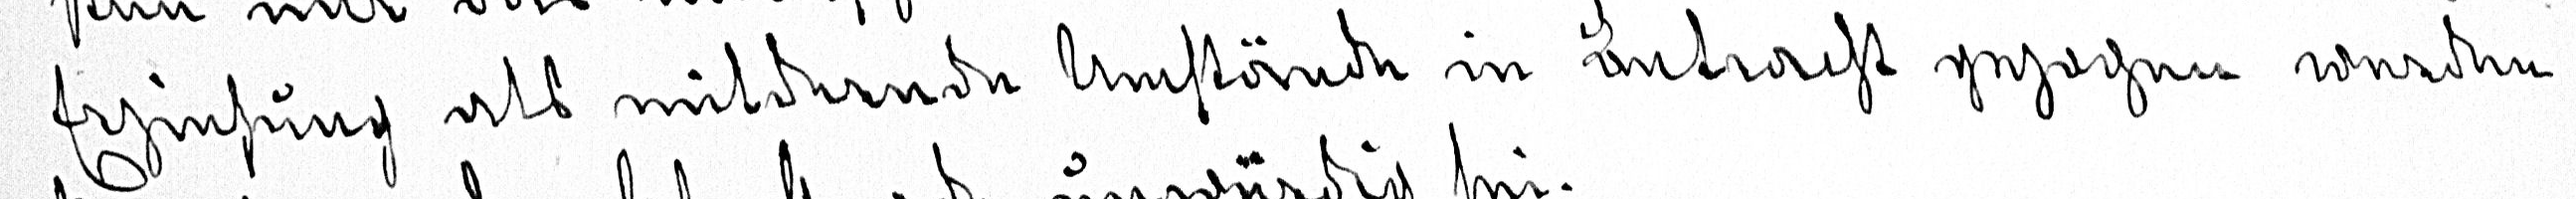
Erziehung als mildernde Umstände in Betracht gezogen werden
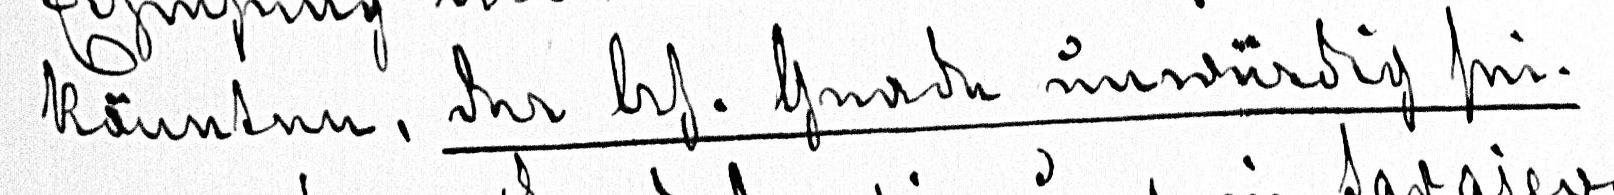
könnten, der As. Gnade unwürdig sei.
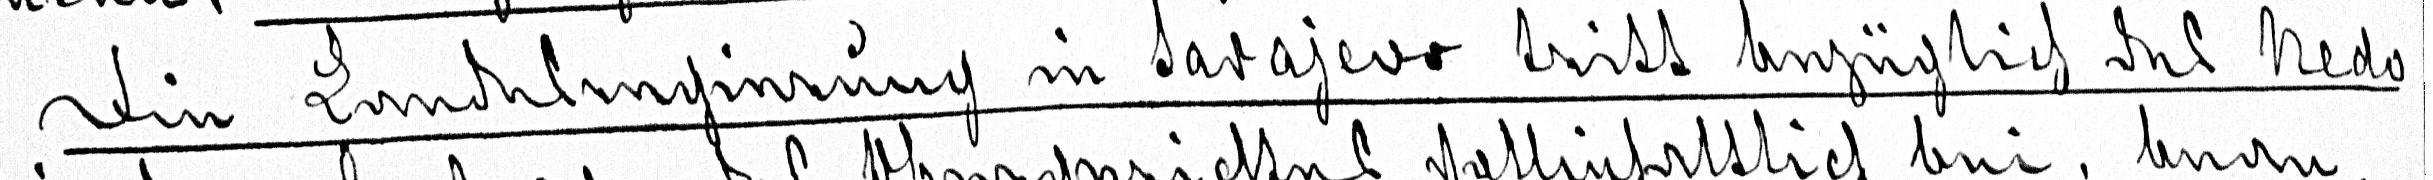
Die Landesregierung in Savajevo tritt bezüglich des Nedo
